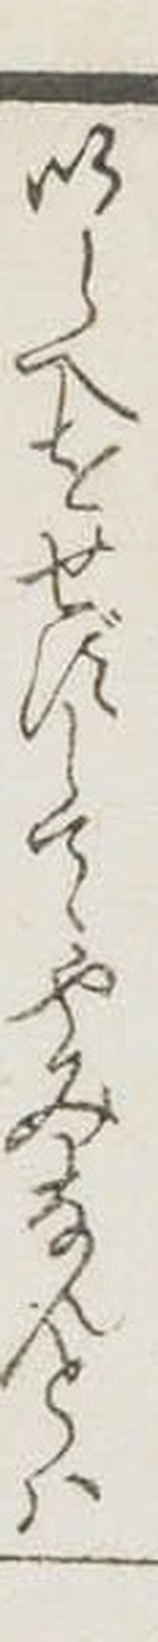いらへをせずしてやみなんとは
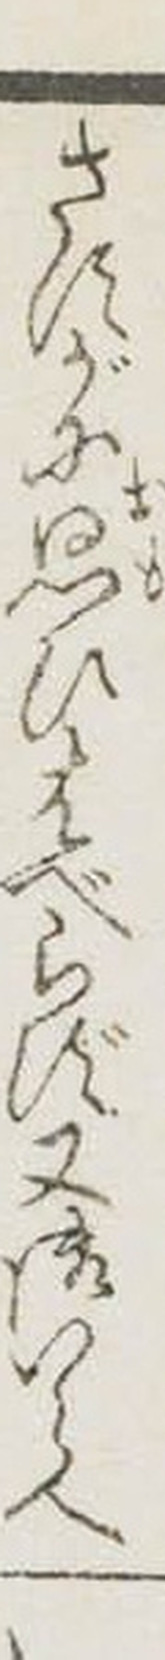さすがに思ひはべらず又御いらへ
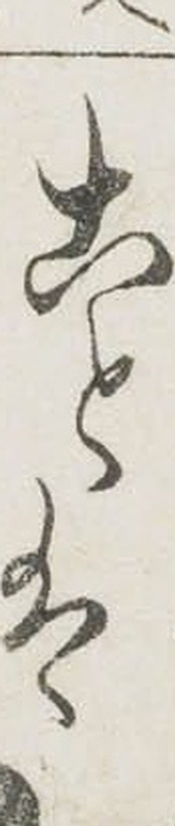ことは
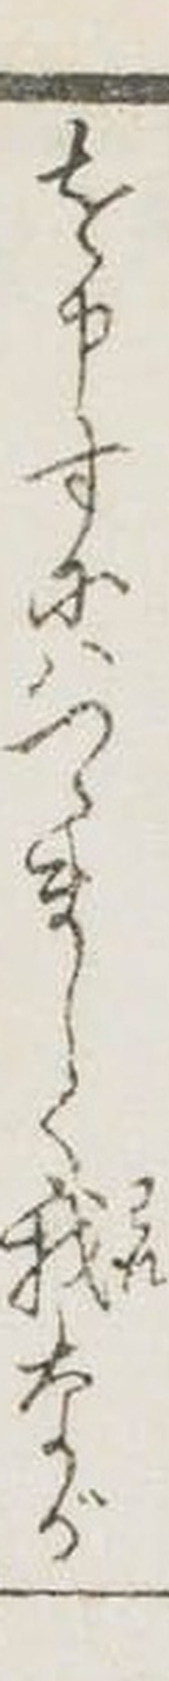を申すにはつゝましく我なが
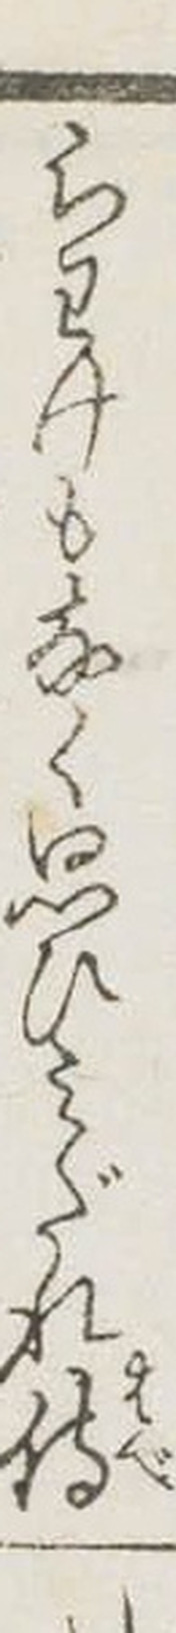らわけもなく思ひみだれ侍
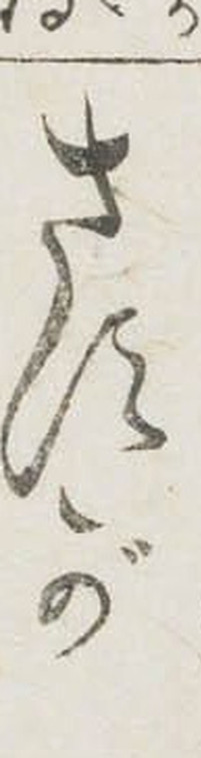さすが
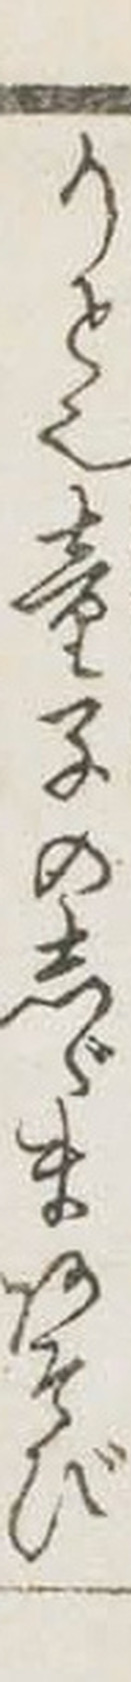りと也童子のしゞまあそび
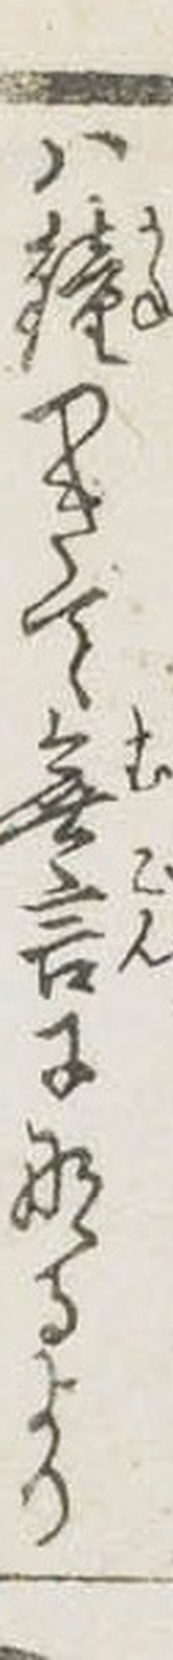は鐘つきて無言になるより
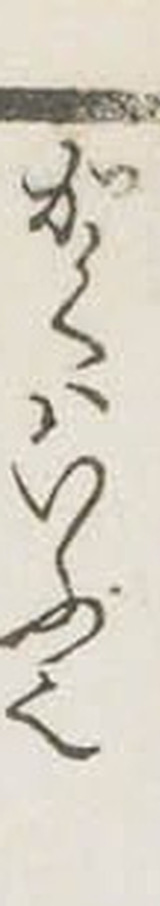かくはいふ也
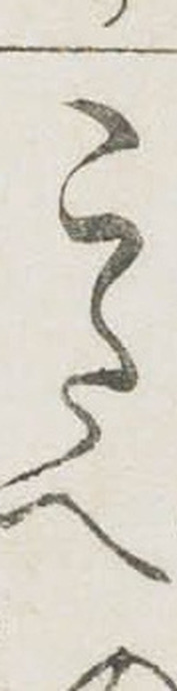こたへ
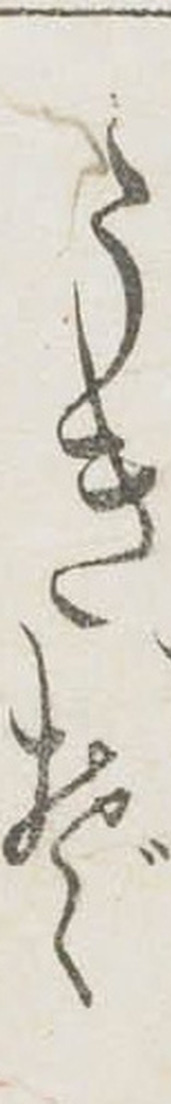うきぞ
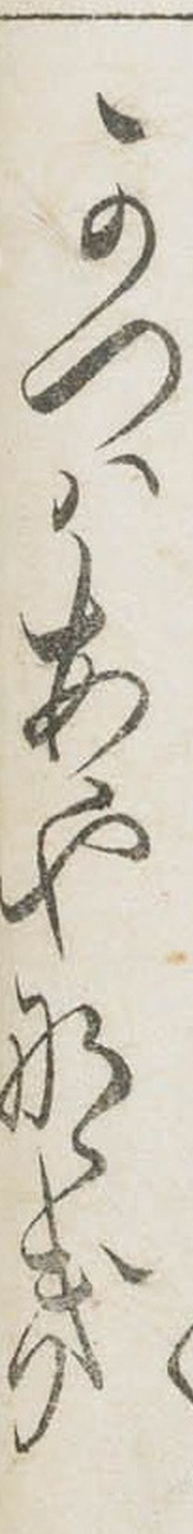かつはあやなき
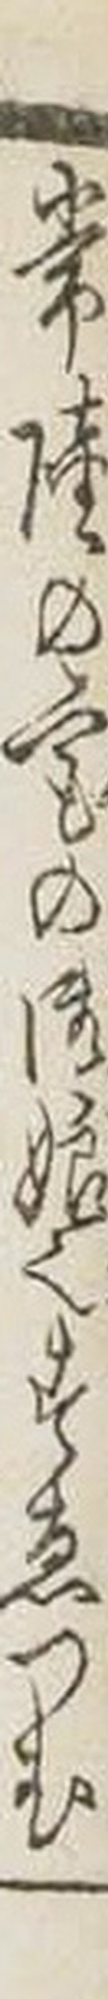常陸の宮の御娘也すゑつむ
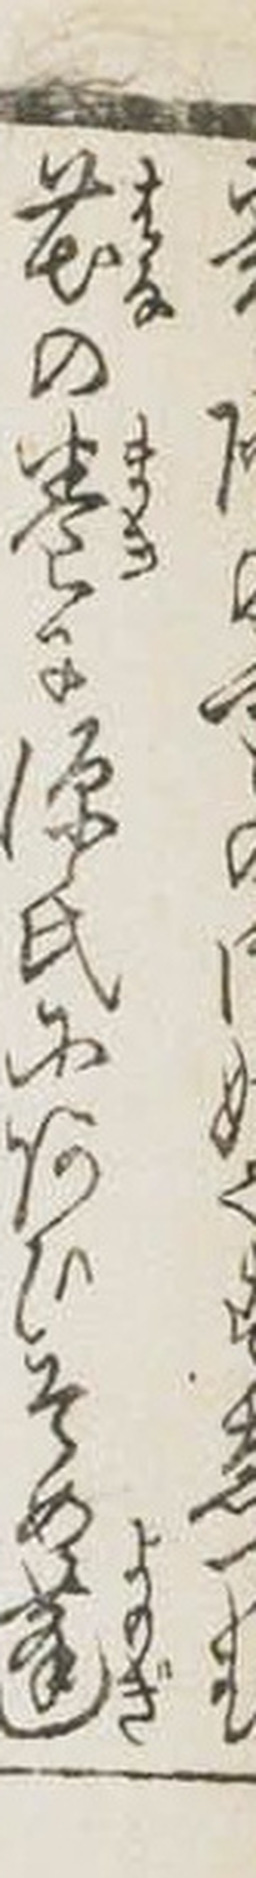花の巻に源氏にあひそめ蓬
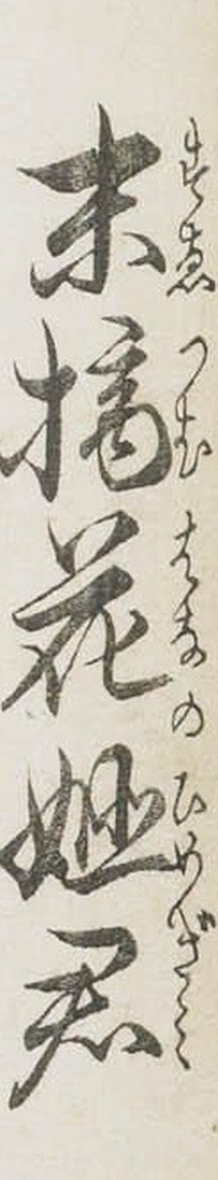末摘花姫君
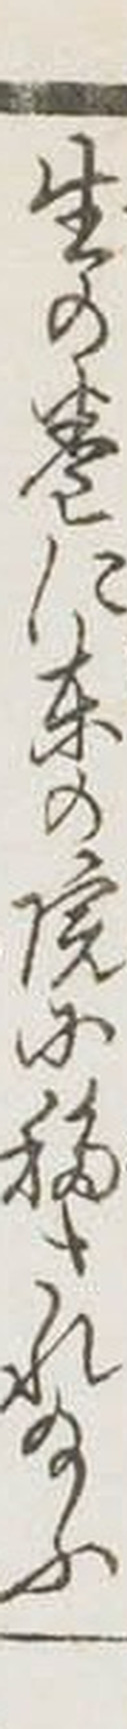生の巻に東の院に移され給ふ
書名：源氏百人一首
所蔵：東京学芸大学教育コンテンツアーカイブ
